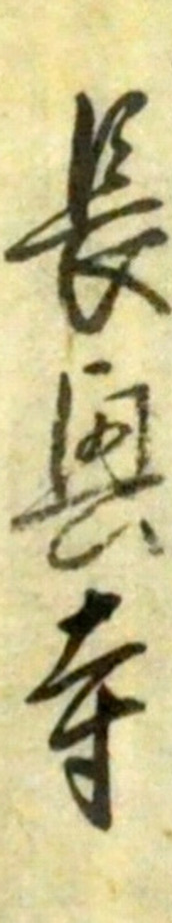長興寺
